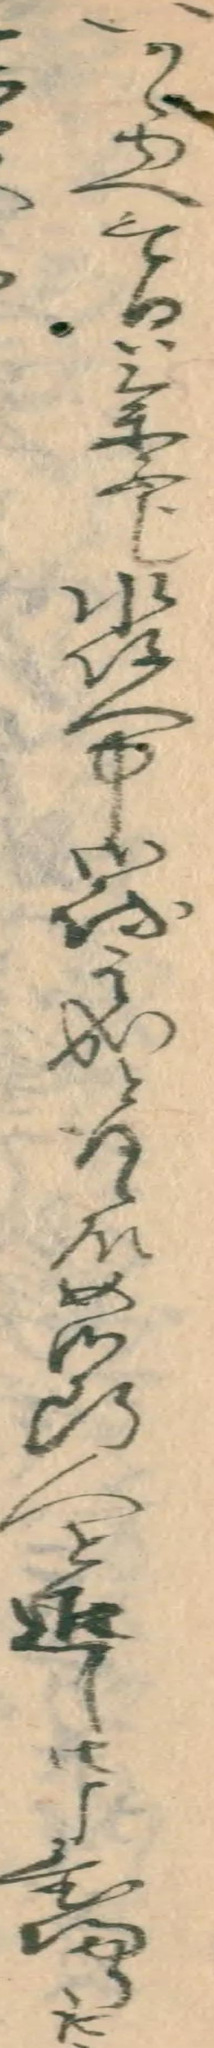いかゝゆへ今日ハ参不申候水役人中御待被成と存候故御断人を進し由申置帰り候由也
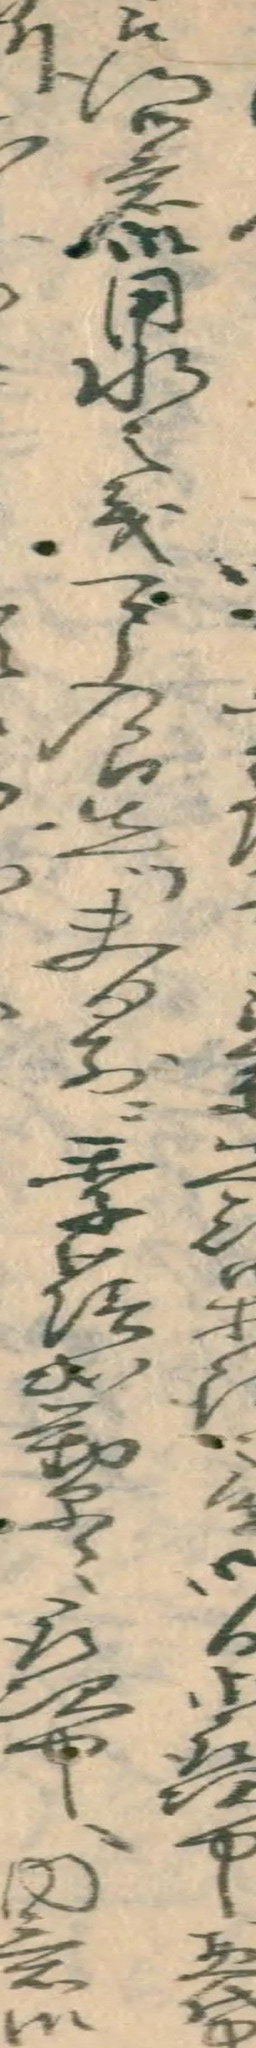被得御意御用水之義可申入候間先ツ夫ゟ前ニ季蔭出勤早々取次中へ内意御
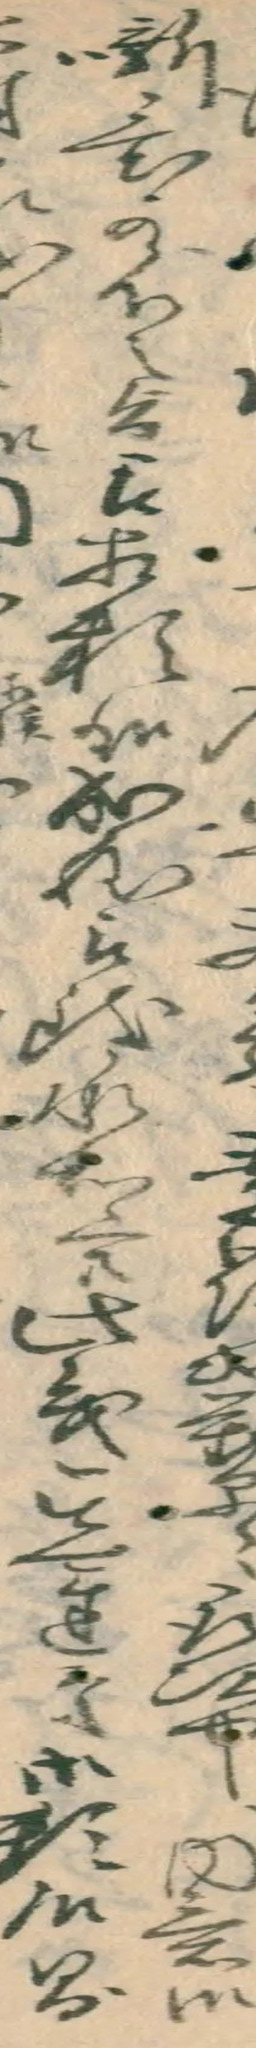噺置可被下之旨被相頼処成程被致承知候へ共此義ハ先達而も御頼故則
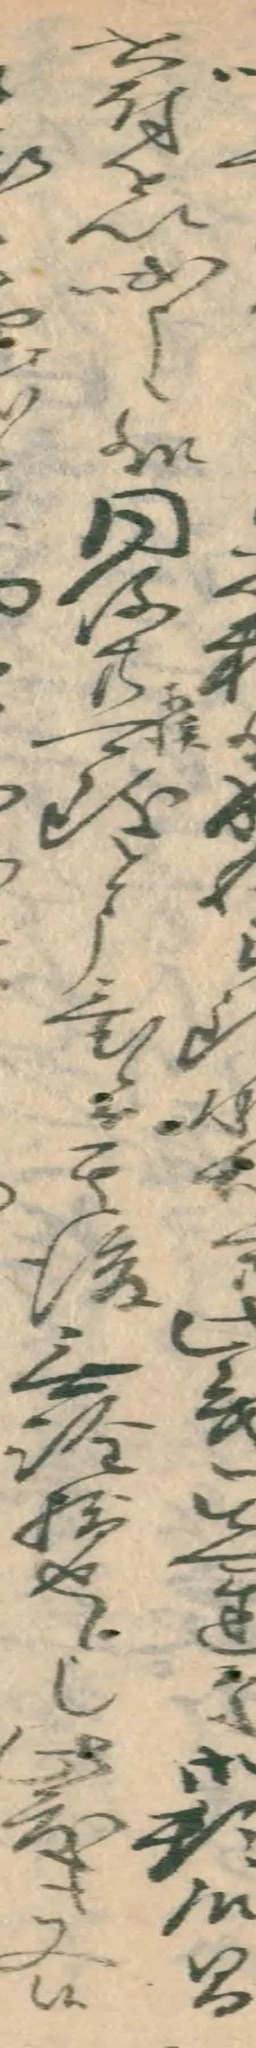書付を以咄申候処同役共相談可致と申置候而其後無詮指返申候此度も又候
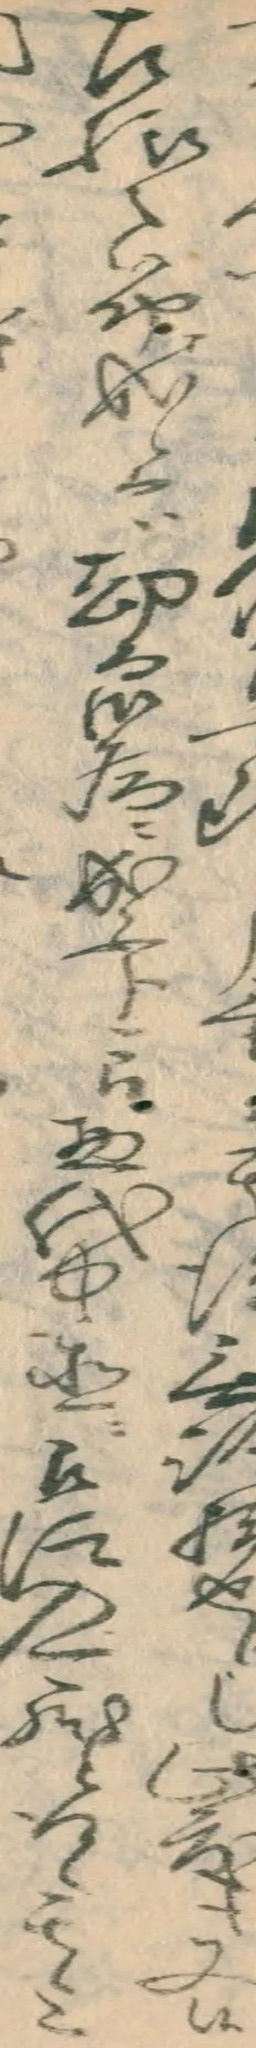左様之筋ニ成候而ハ却而御為ニ成不申候間惣代中直ニ被仰入可然と存候其上
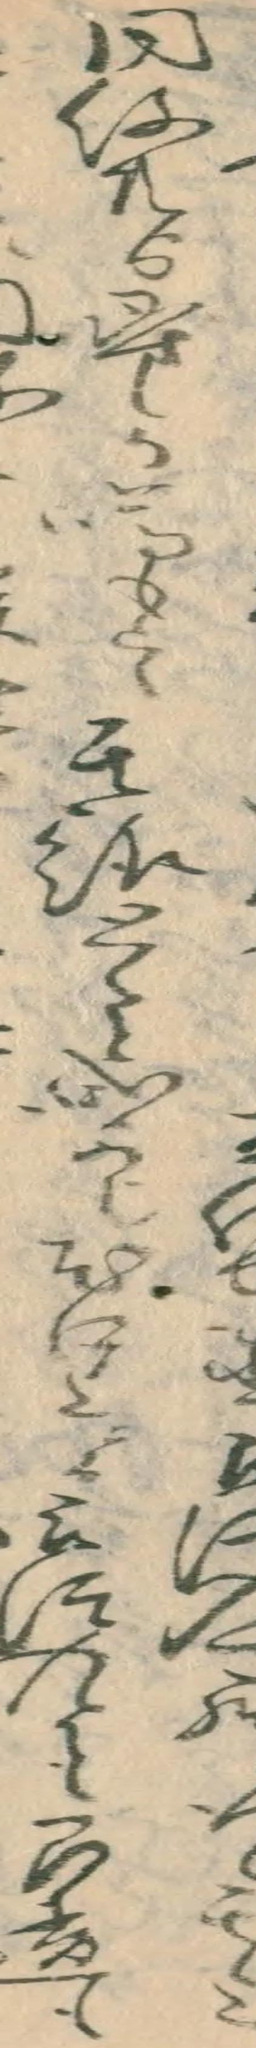同役共ゟ尋候か噂も候ハヽ其趣とくと咄可申候尤口上ニ而被仰入候ても間違も
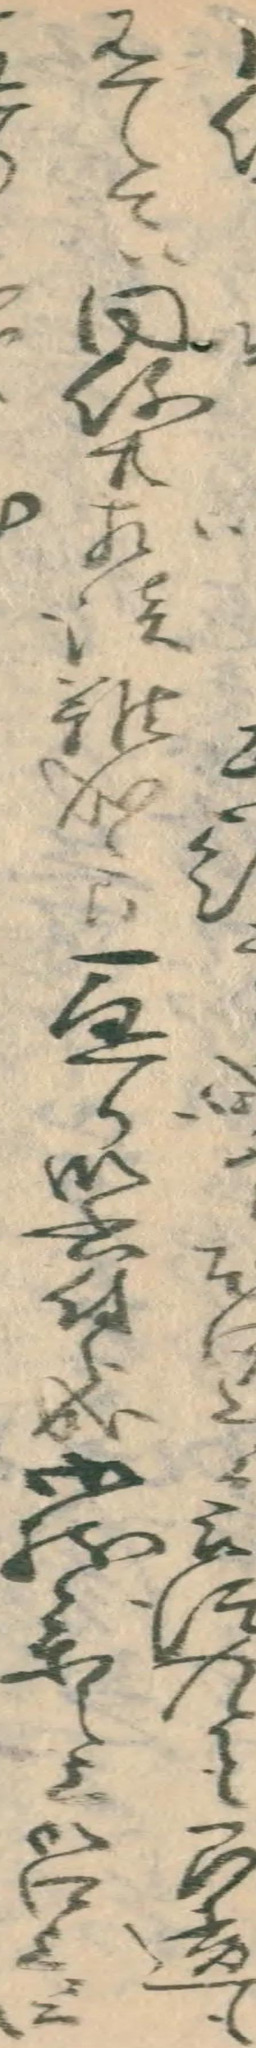有之候てハ同役共相談難成候間一通り御書付被成御持参之上御口上ニ而も
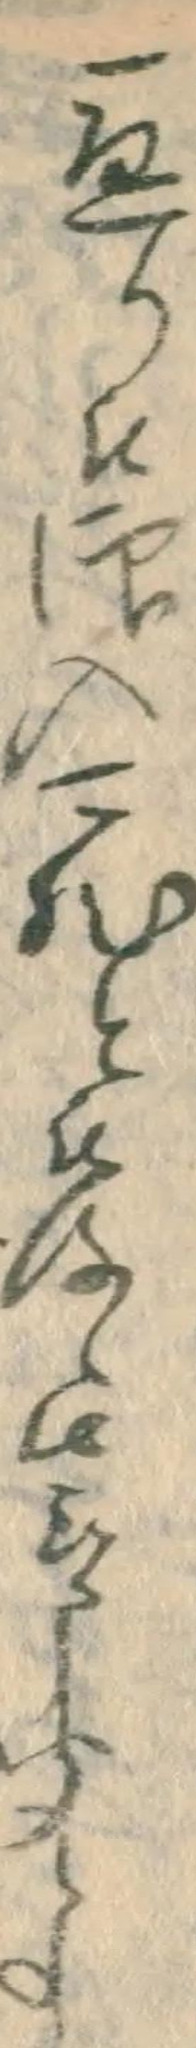一通り被仰入可然と被存候由被申聞候事
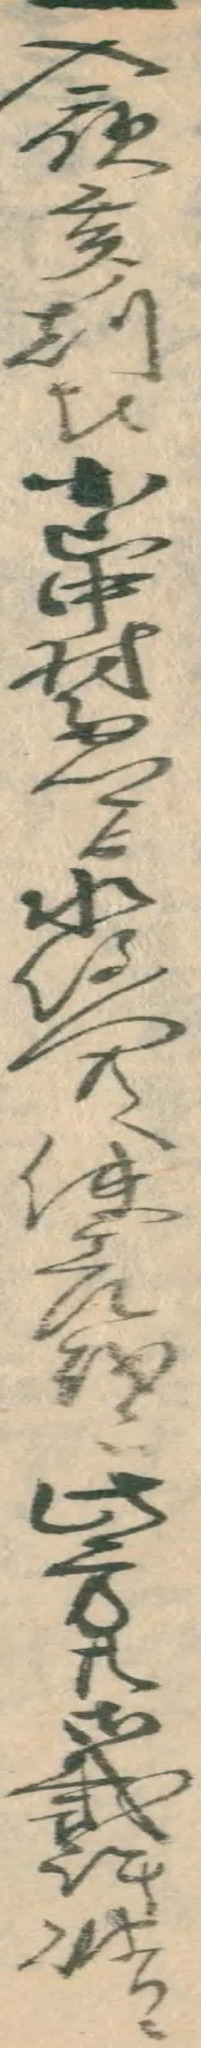一入夜亥ノ刻比小山中村両郷ゟ水役人共へ使差越候ハ此方共御裁許破りニ
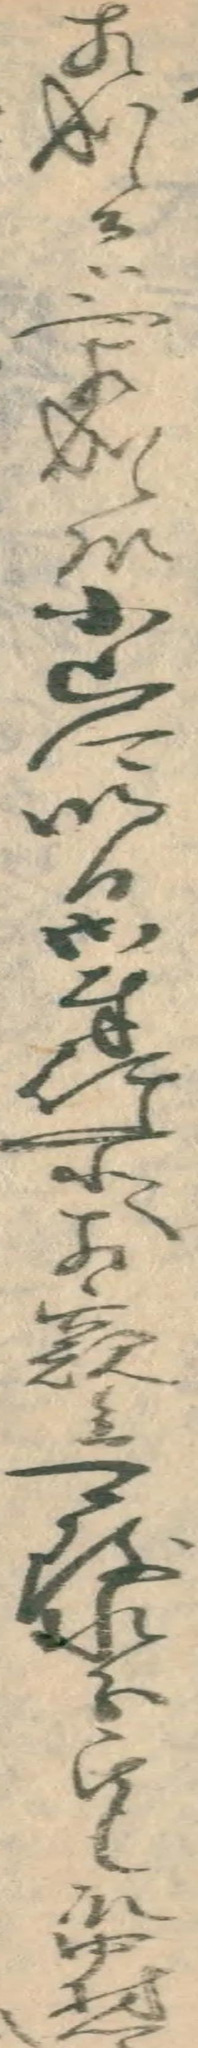相成候而ハ不相成候故小山郷明日御奉行所へ相窺候而可致水分由申候故中村郷も
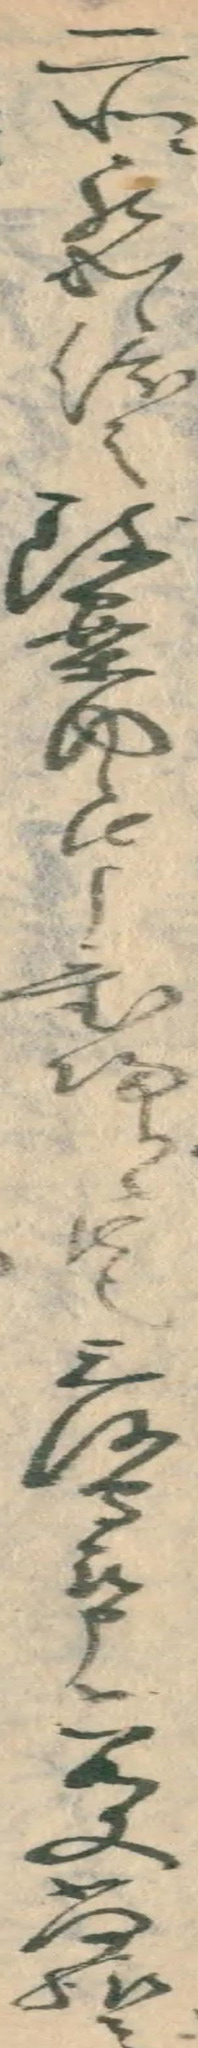一所ニ罷出候依之致案内由申置帰り候由也三河守被申ハ若又如何様之
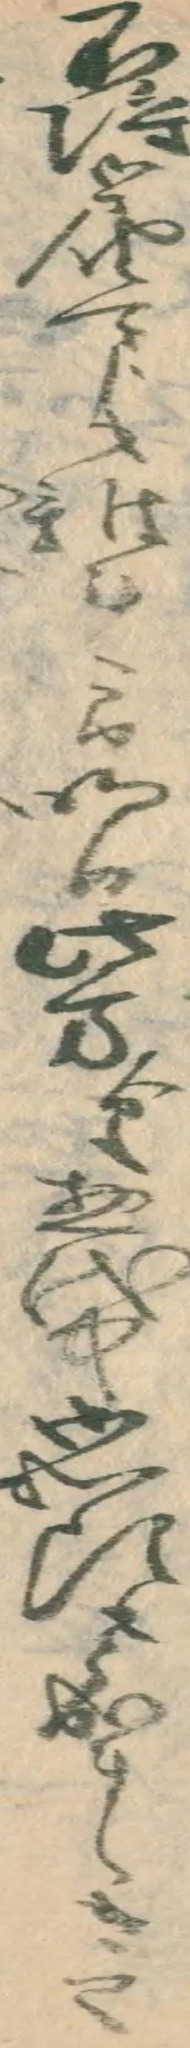不埒御届可申も難計候間明日此方ゟも惣代中御出頭も被成ましき候ハヽ
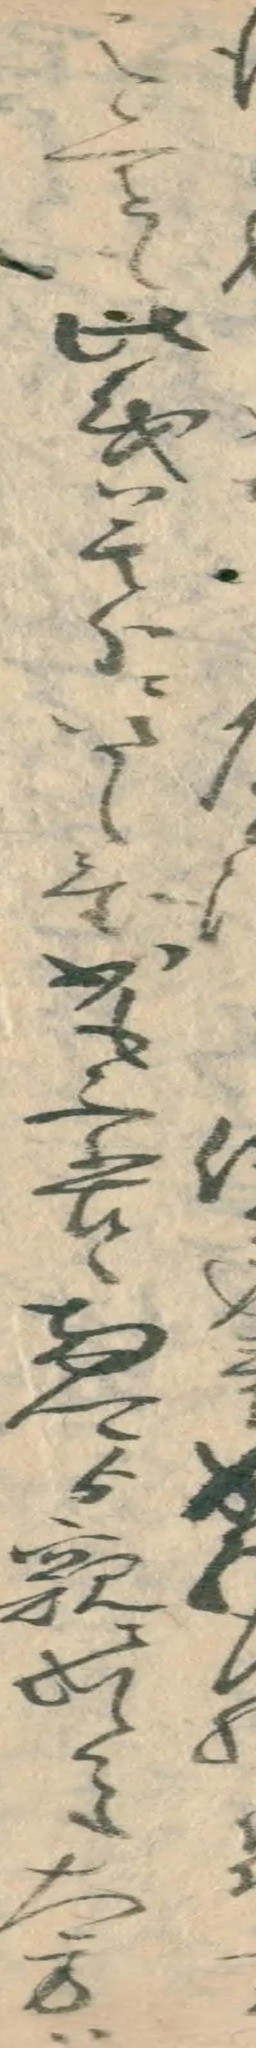之候へとも此義ハ其分にいたし置少も不苦候両郷ゟ窺ニ出候ても大方ハ
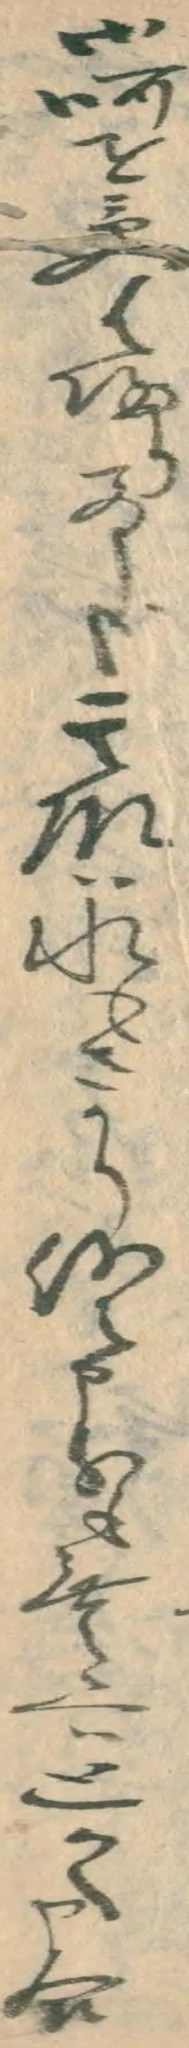御呵を受候て帰り可申哉其故ハ水もさかり何之申分も無之候へハとかく申合

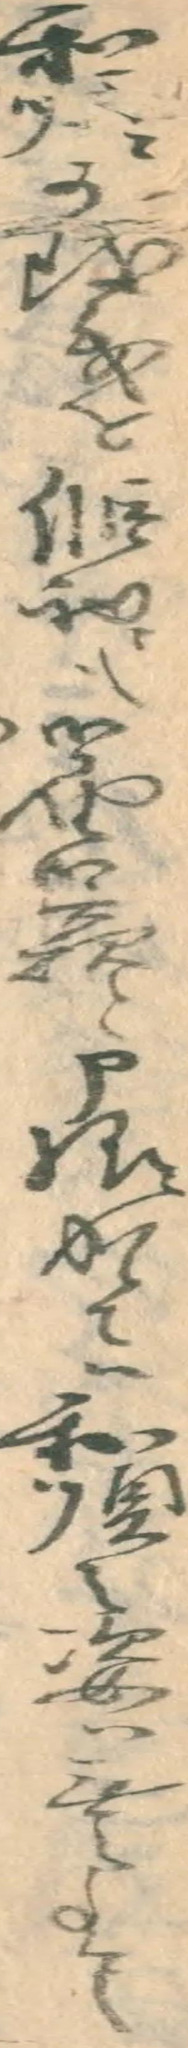和順ニ可致義を仮初ニも御届御窺と申様ニ成候てハ和順之姿ハ無之事ニ候
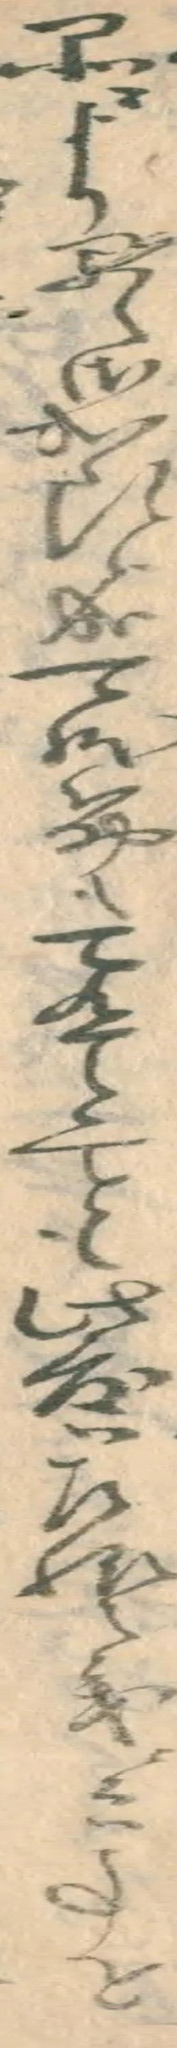品ニより早く御出頭被成可然筋も可有候へとも此度ハ左様之義ニ而ハ事を
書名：賀茂社記録. 第58冊
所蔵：国立国会図書館 National Diet Library, JAPAN
